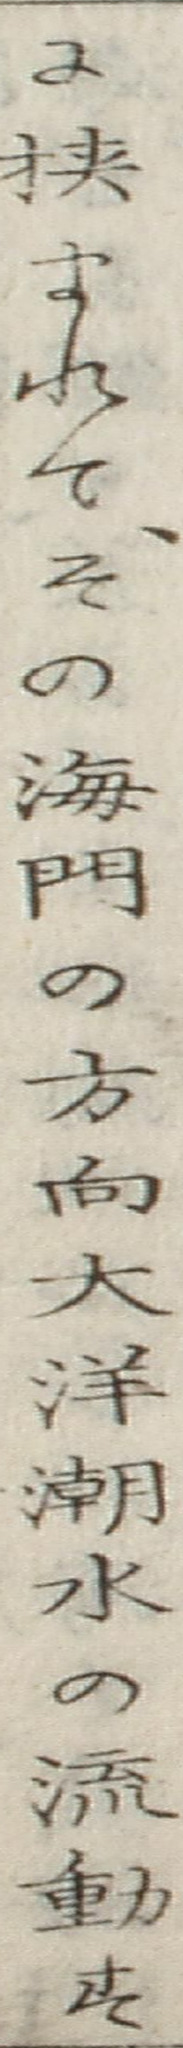に挟まれて、その海門の方向大洋潮水の流動す
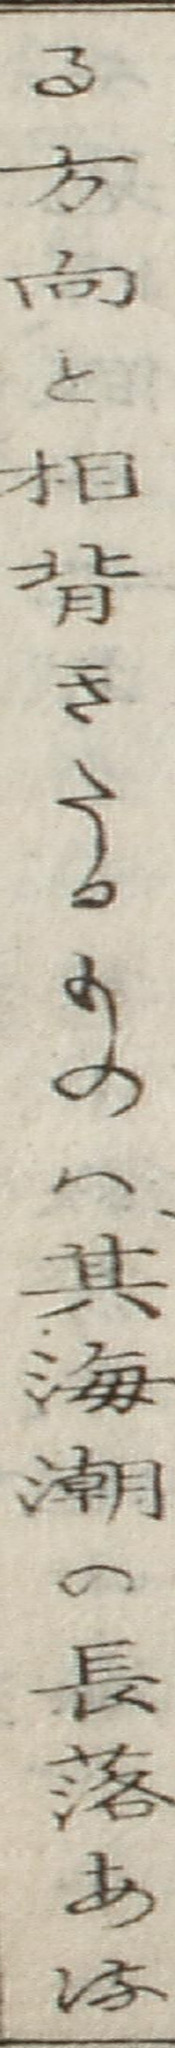る方向と相背きたるものは、其海潮の長落ある

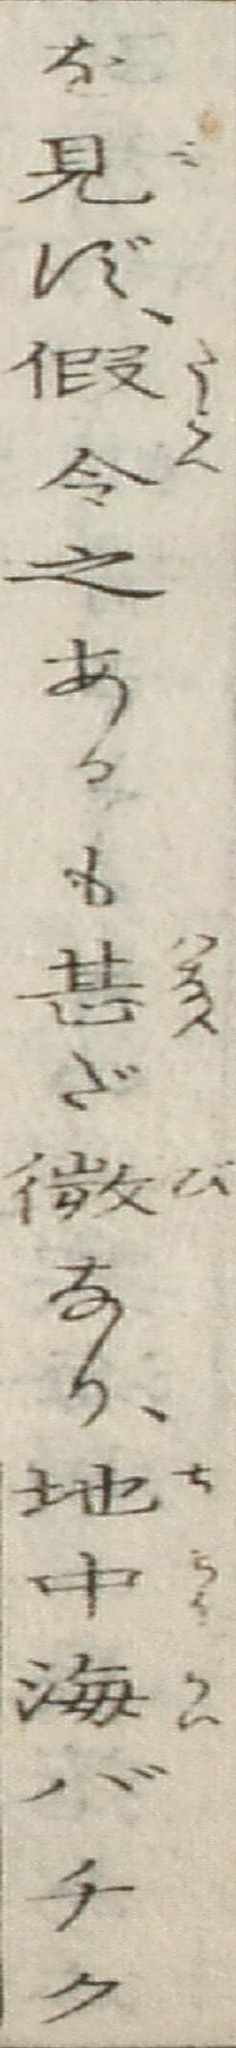を見ず、仮令之あるも甚だ微なり、地中海バチク
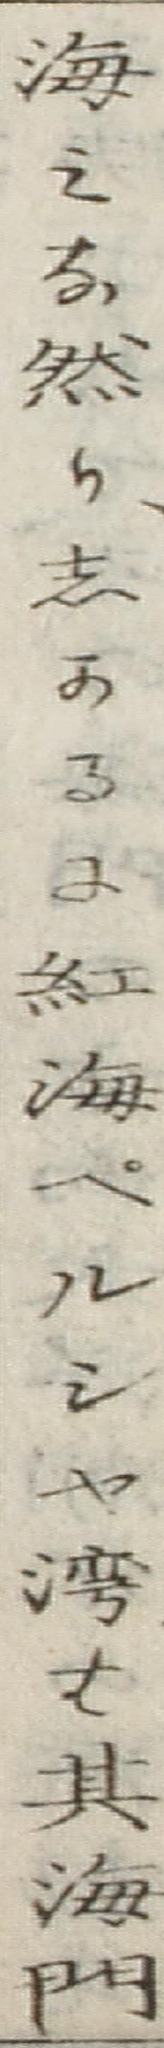海みな然り、しかるに紅海ペルシヤ湾は、其海門
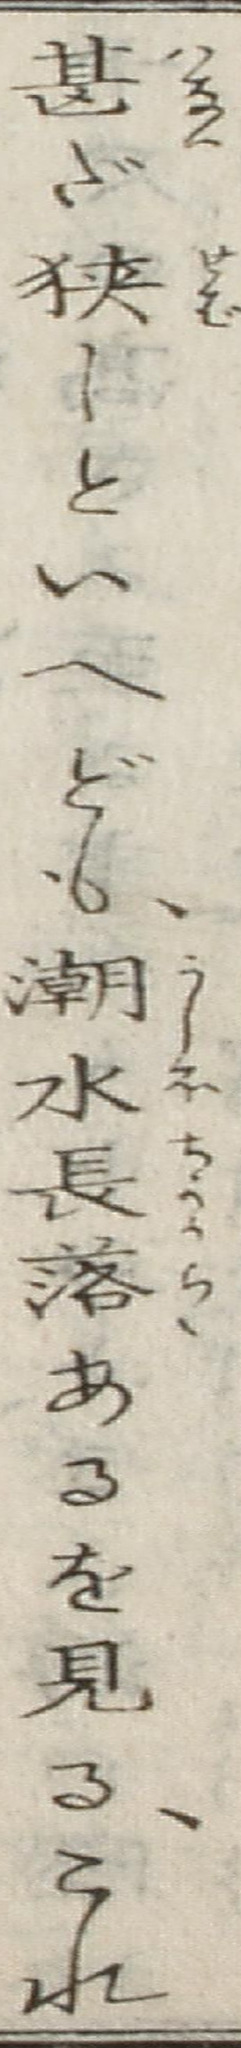甚だ狭しといへども、潮水長落あるを見る、これ
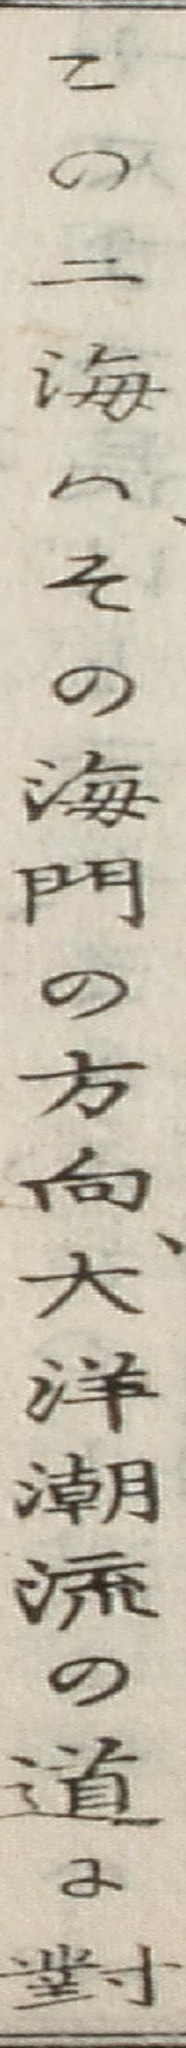この二海は、その海門の方向、大洋潮流の道に対
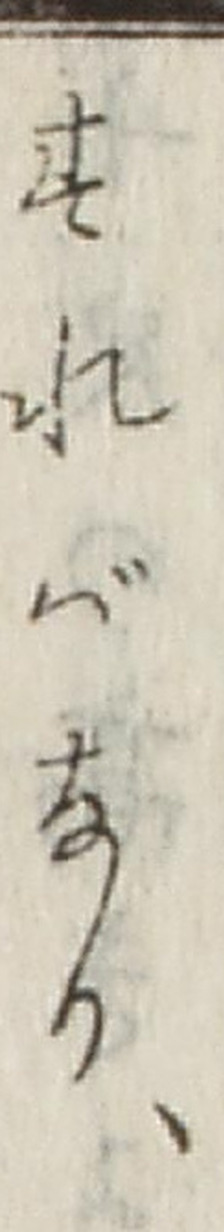すればなり、
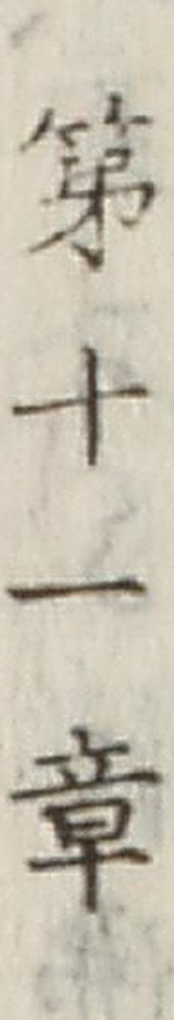第十一章
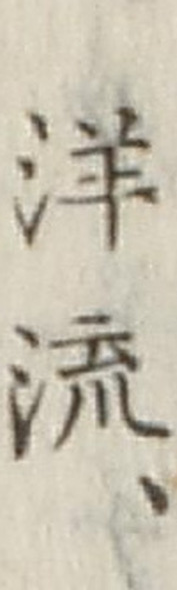洋流、
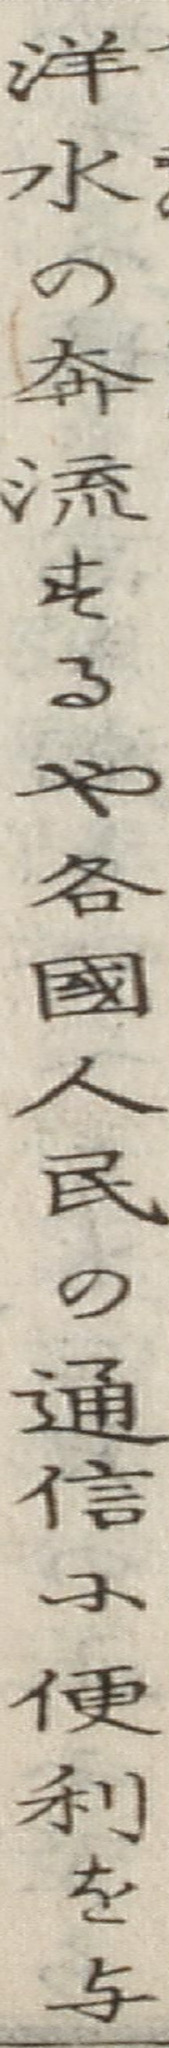洋水の奔流するや、各国人民の通信に便利を与
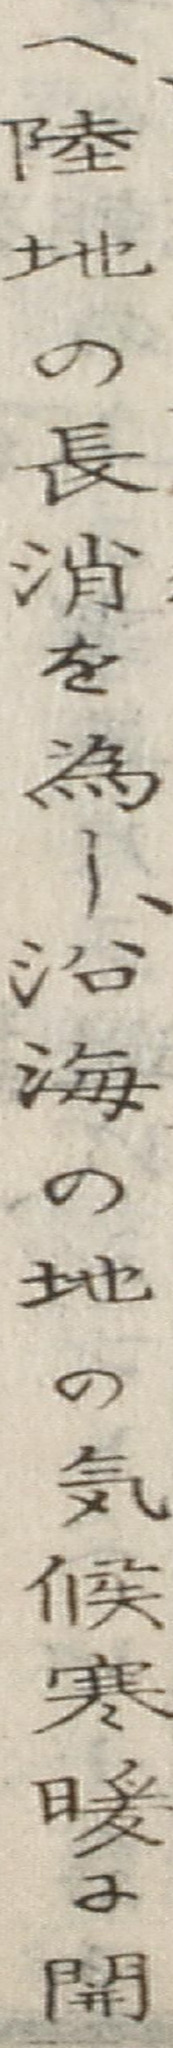へ、陸地の長消を為し、沿海の地の気候寒暖に開
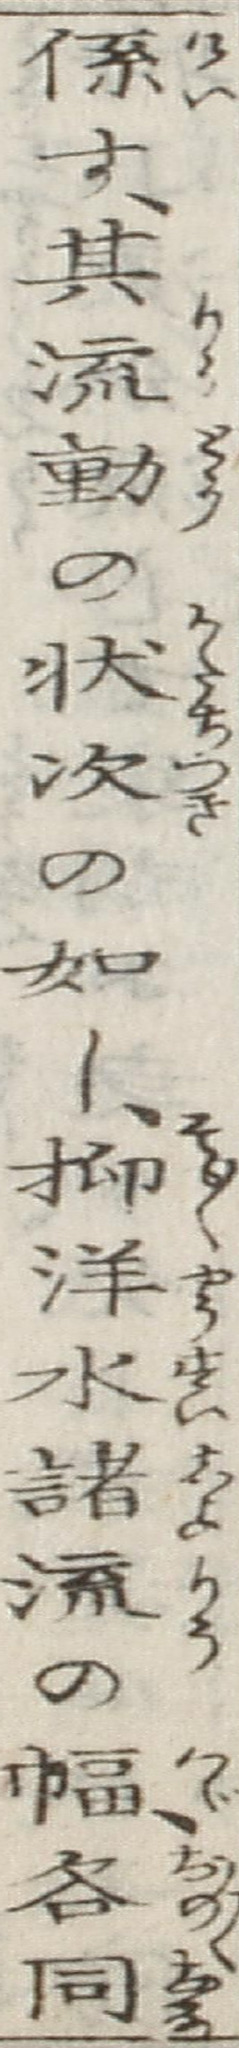係す、其流動の状次の如し、抑洋水諸流の幅、各同
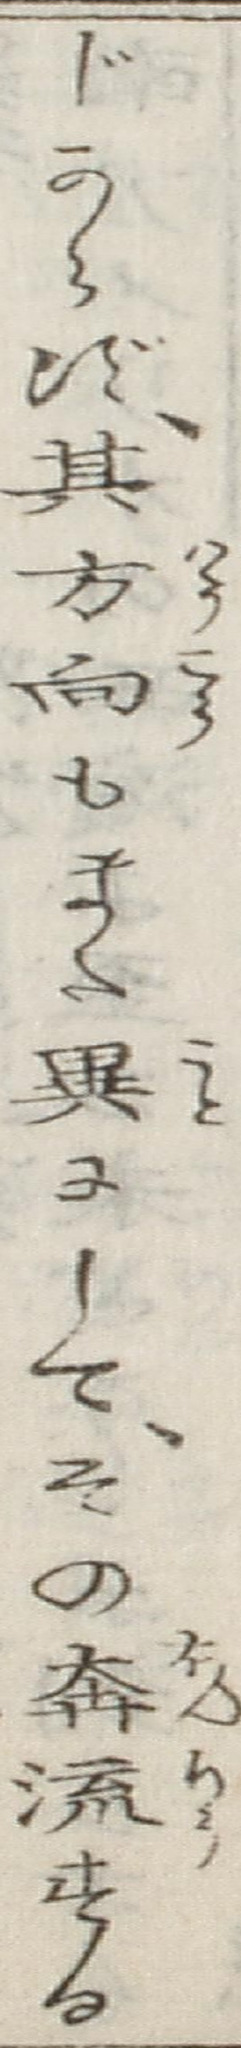じからず、其方向もまた異にして、その奔流する
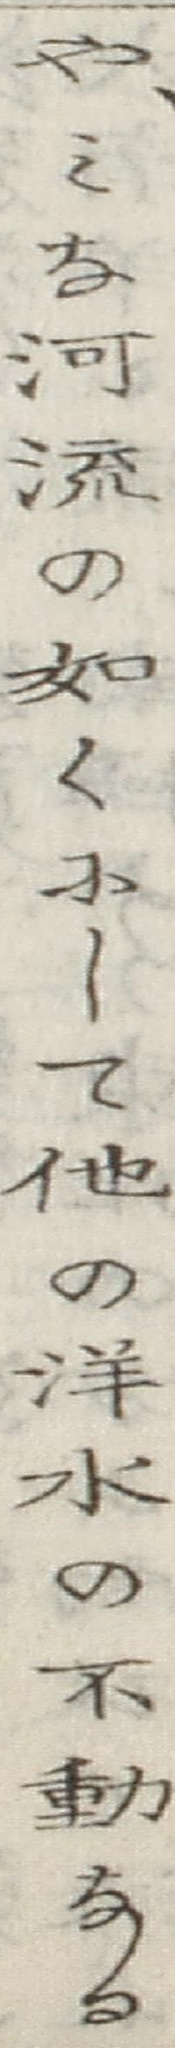や、みな河流の如くにして、他の洋水の不動なる
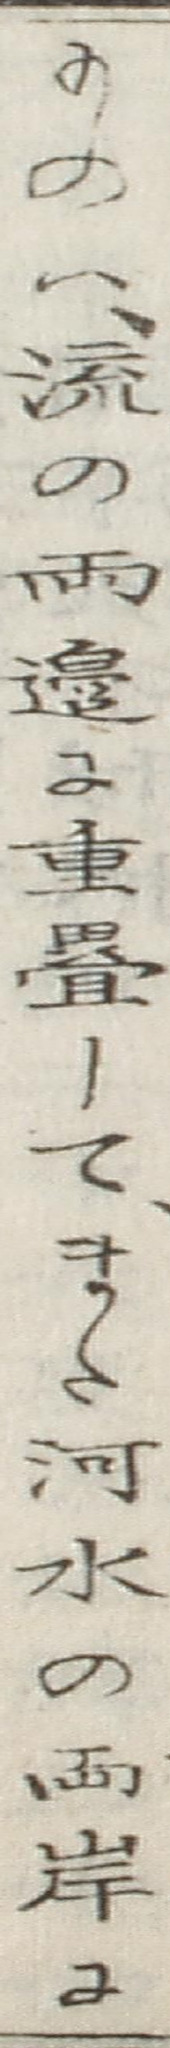ものは、流の両辺に重畳して、また河水の両岸に
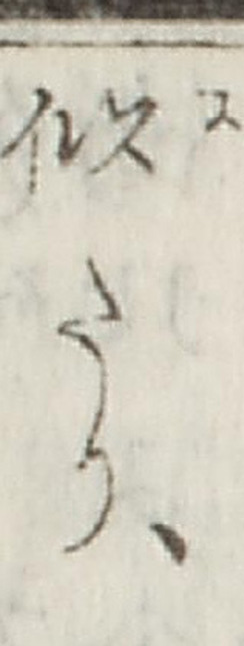似たり、
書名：訓蒙　天然地理學　中
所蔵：東京大学地震研究所図書室 Earthquake Research Institute Library, The University of Tokyo, JAPAN
